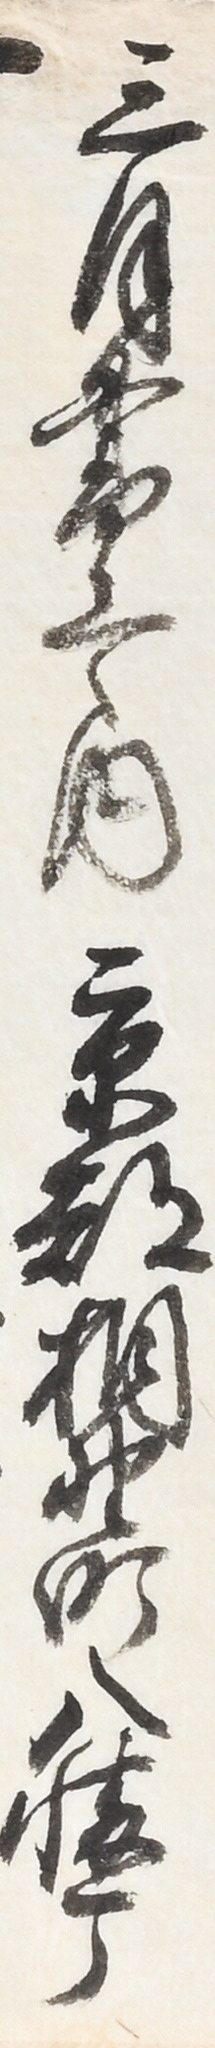三月書上之内京都相野町八幡丁
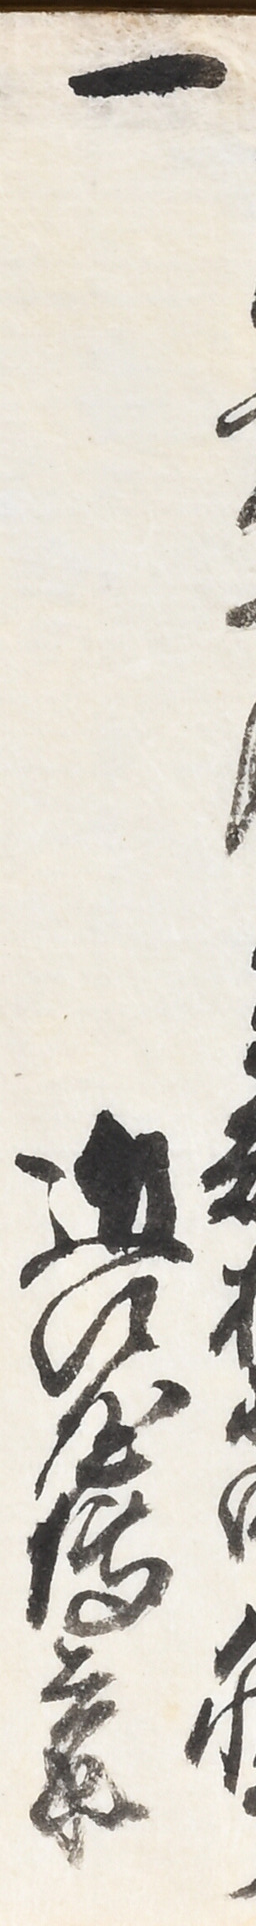一近江屋伝兵衛
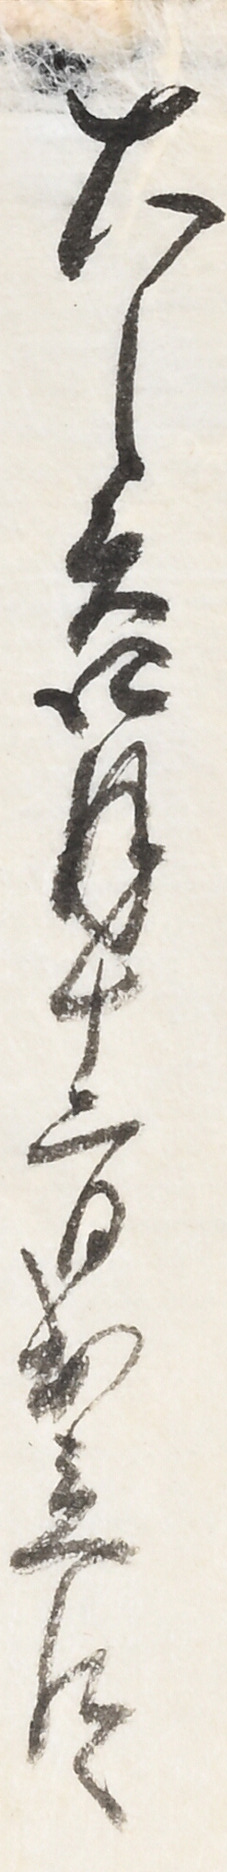右之者四月十二日出立仕候
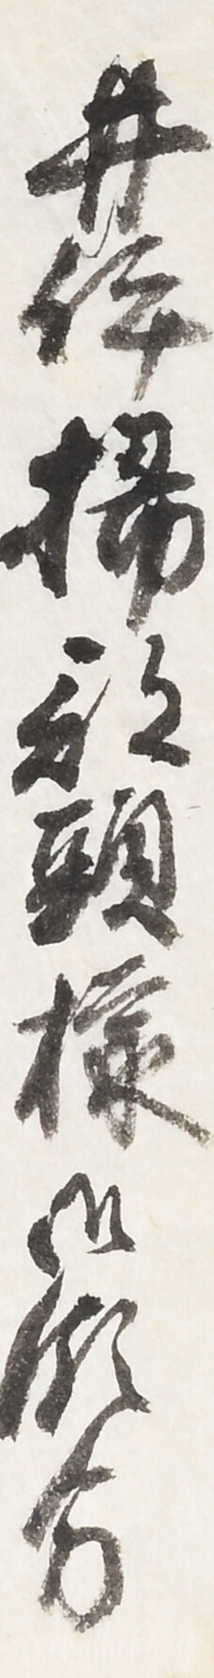井伊掃部頭様御領分
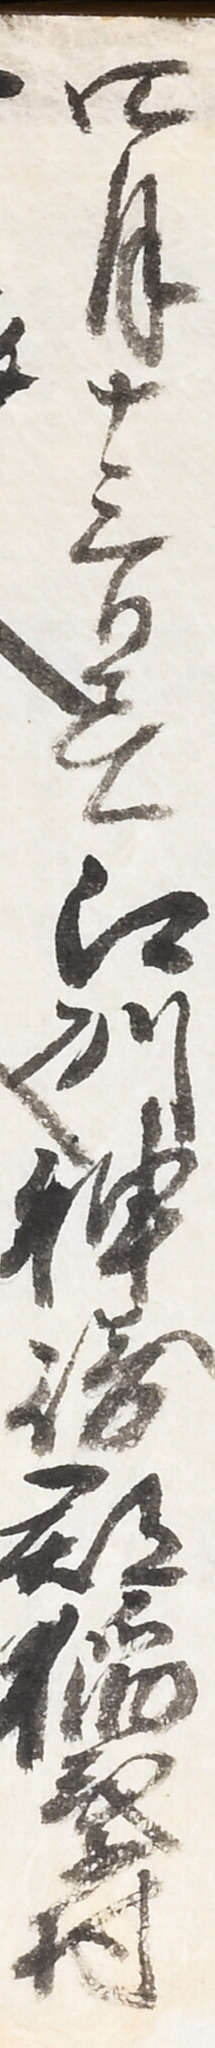四月十三日着江州神崎郡稲葉村
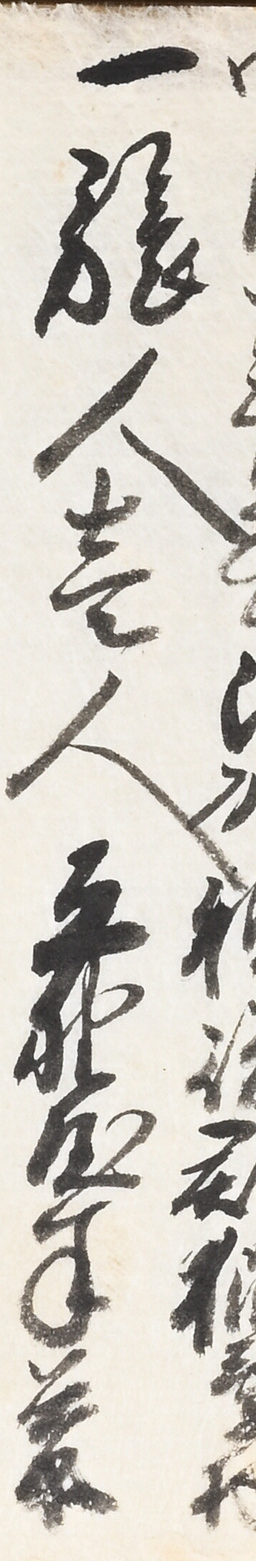一旅人壱人平野屋半兵衛
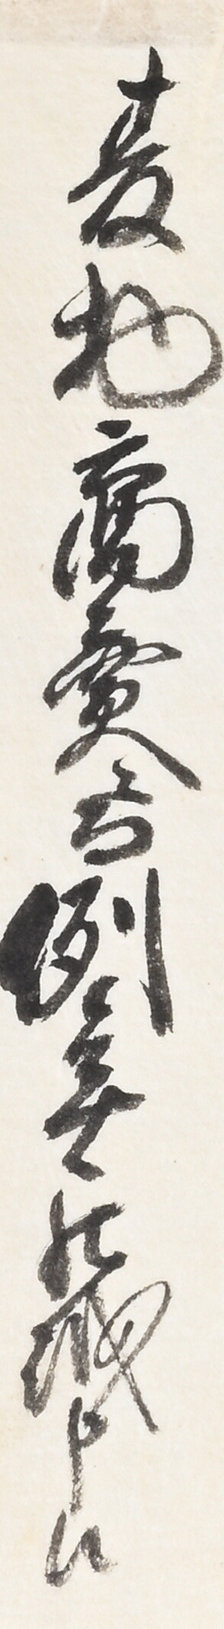夏物商売ニ而例年罷越申候
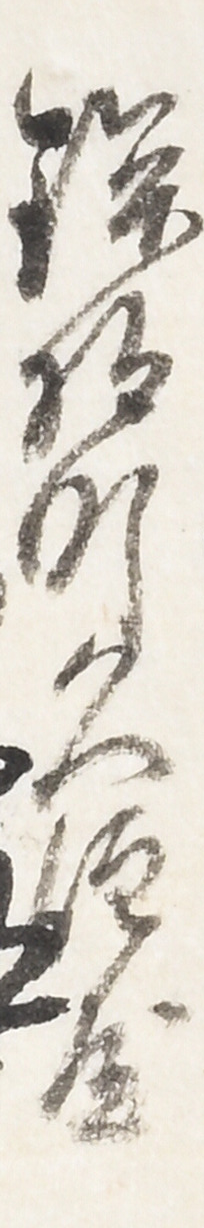鉾持町久住屋
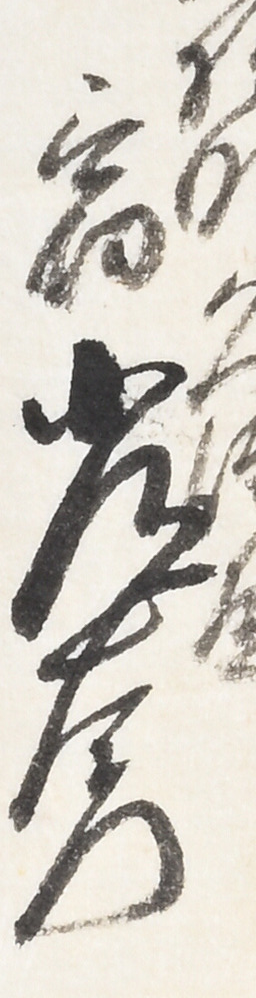宿常右衛門
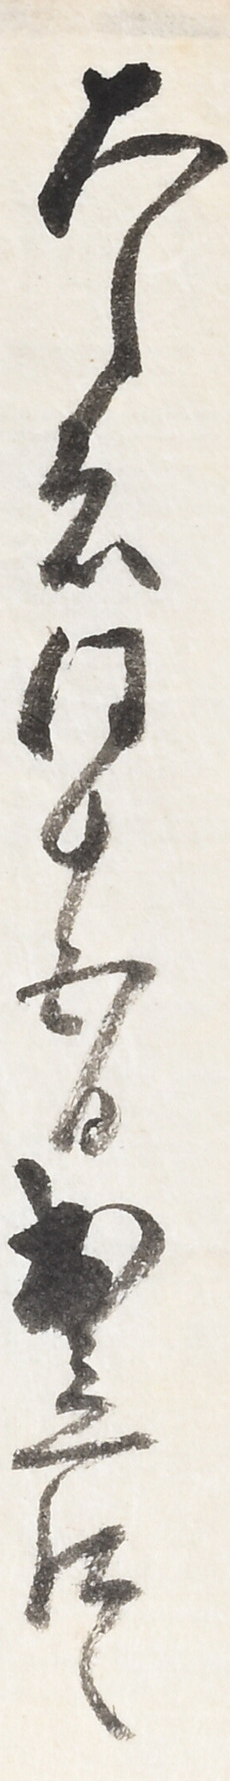右之者同十五日出立仕候
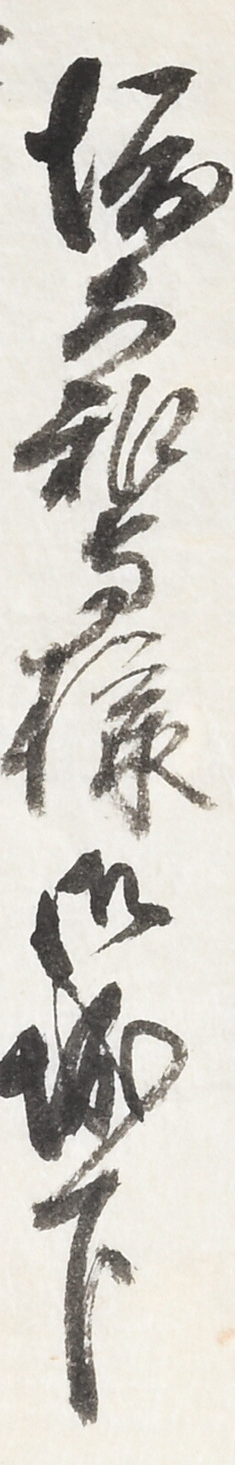堀大和守様御城下
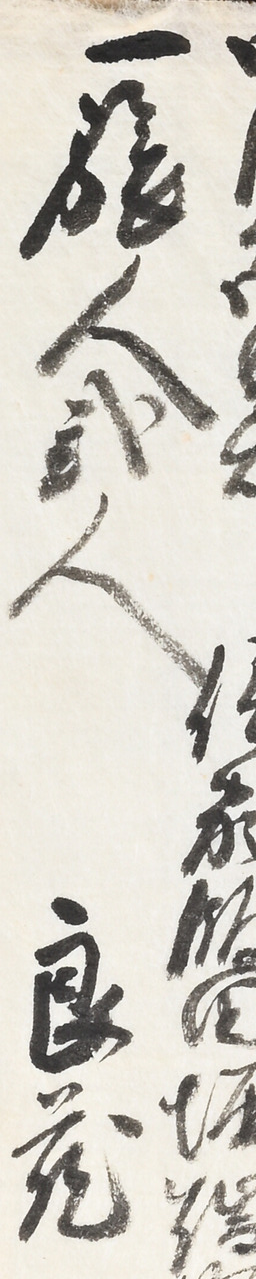一旅人弐人良蔵
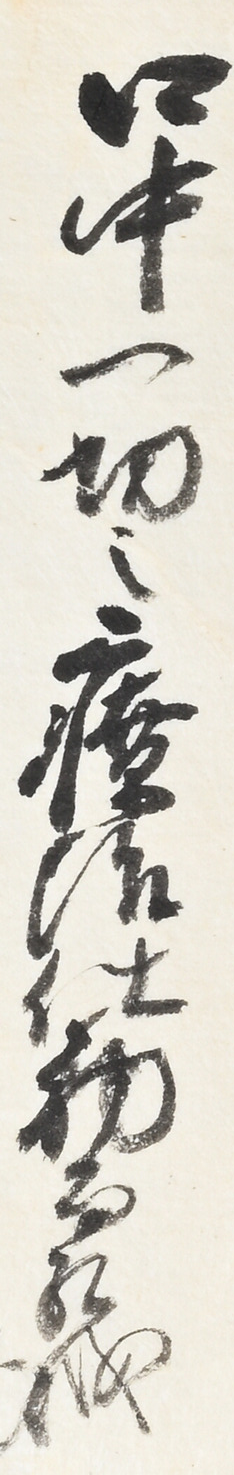口中一切之療治仕初而罷越
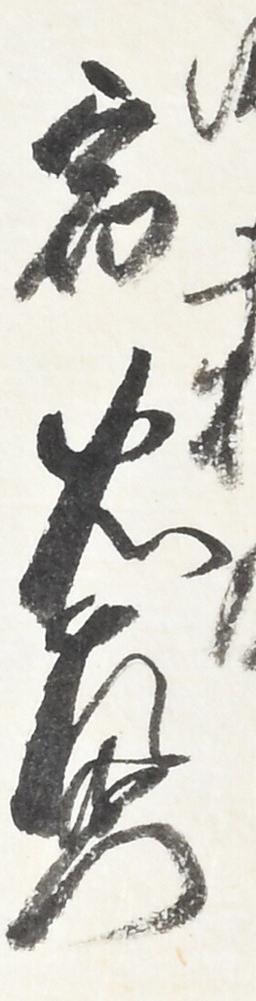宿忠左衛門
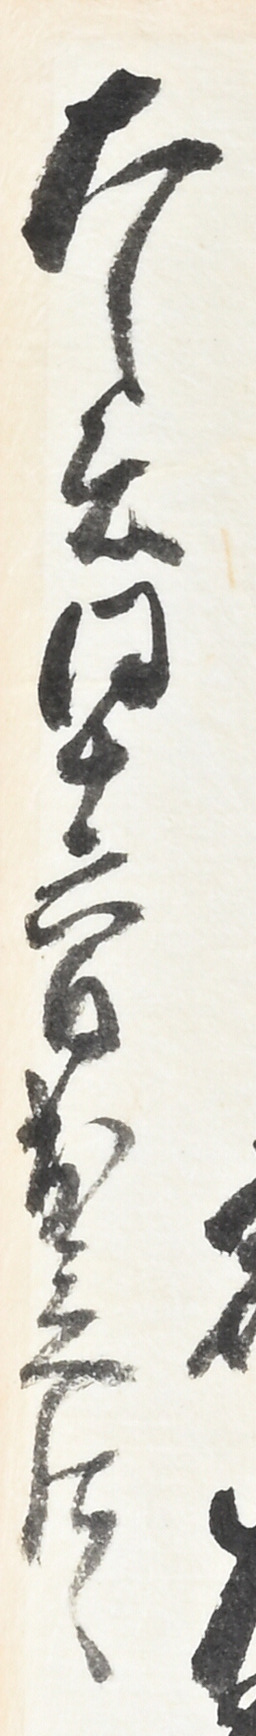右之者同十六日出立仕候

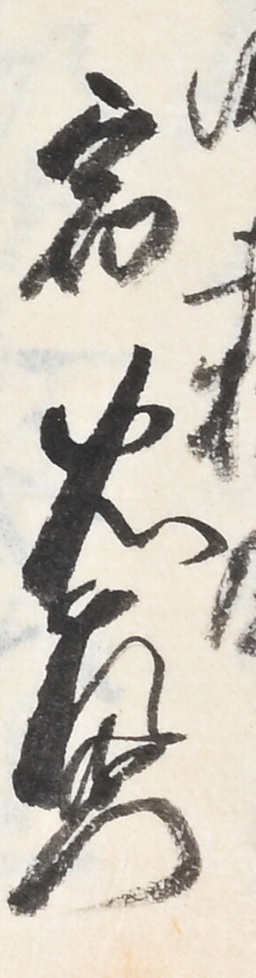宿金右衛門
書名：旅人泊控帳
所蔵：伊那市立高遠町図書館・合同会社AMANE
